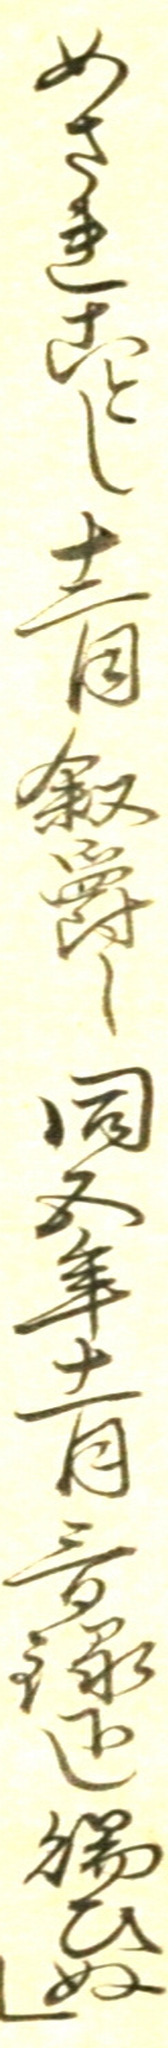めされことし十二月叙爵し同五年十一月三日録下し賜ひぬ」
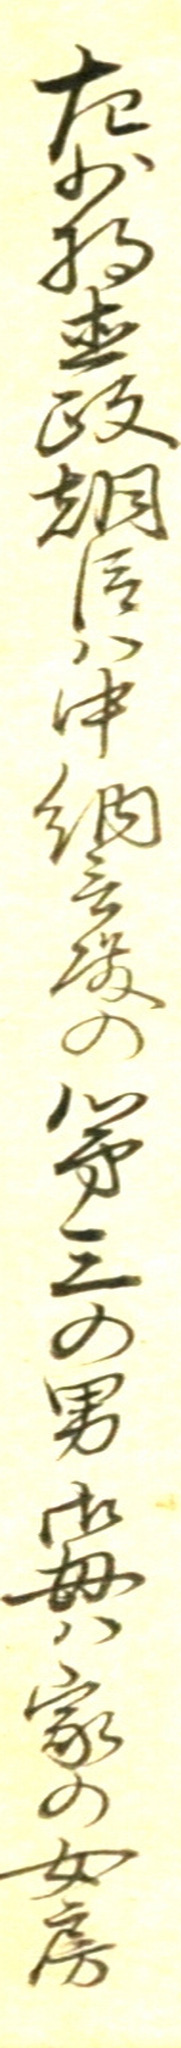左少将直政朝臣は中納言殿の第三の男御母は家の女房
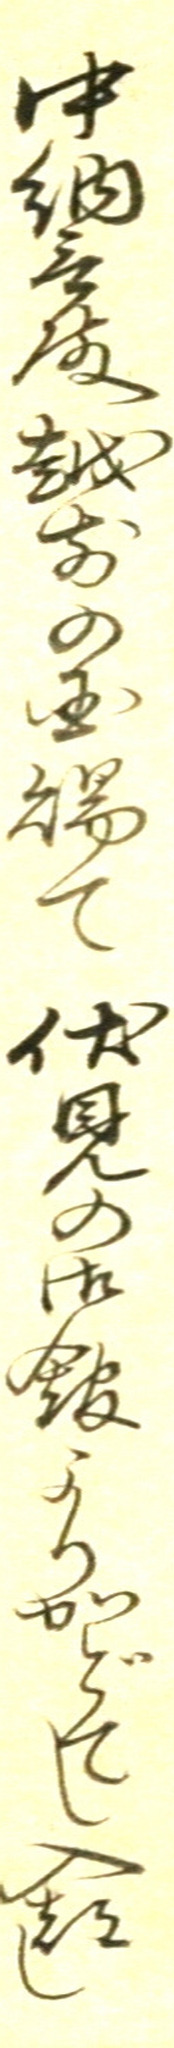中納言殿越前の国賜て伏見の御館よりかどてし入都し
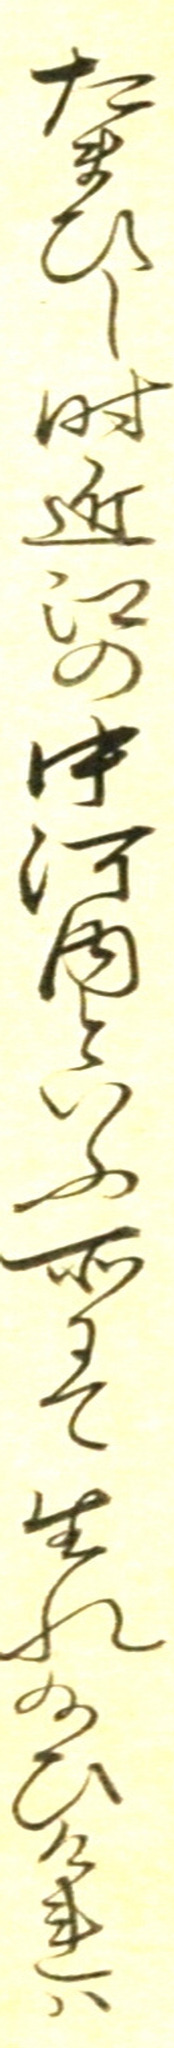たまひし時近江の中河内といふ所にて生れ給ひけれは
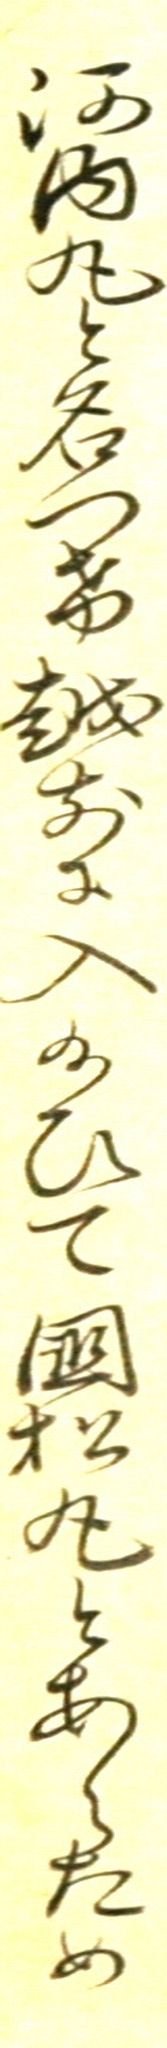河内丸と名つけ越前に入給ひて国松丸とあらため

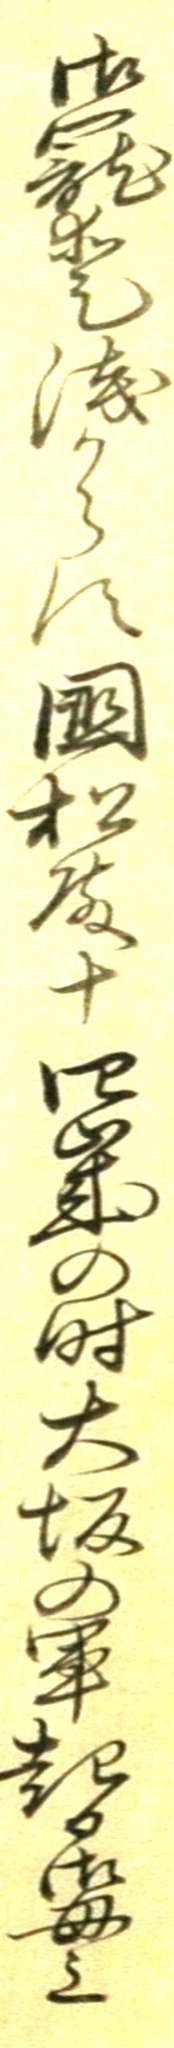御寵愛浅からす国松殿十四歳の時大坂の軍起る御母上
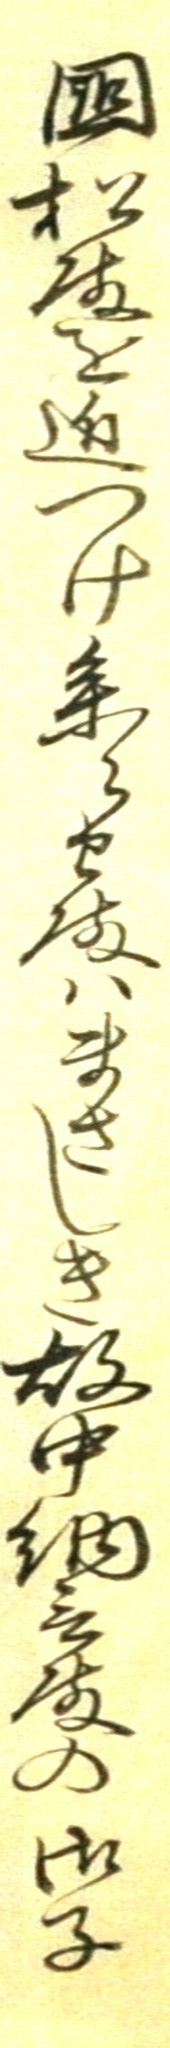国松殿を近つけ参らせ殿はまさしき故中納言殿の御子
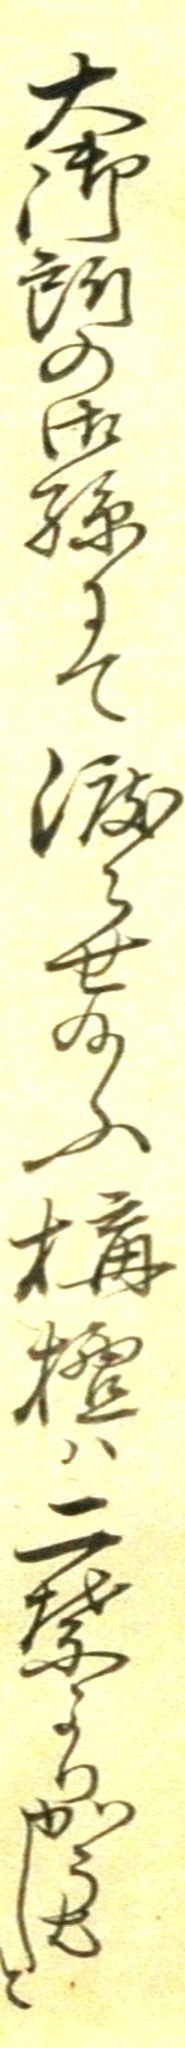大御所の御孫にて渡らせ給ふ栴檀は二葉よりかうはしと
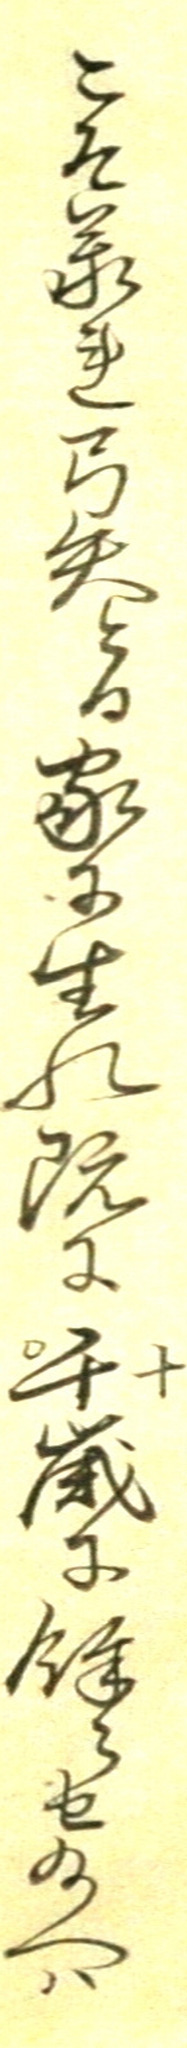こそ承れ弓矢とる家に生れ既に十歳に余らせ給へは
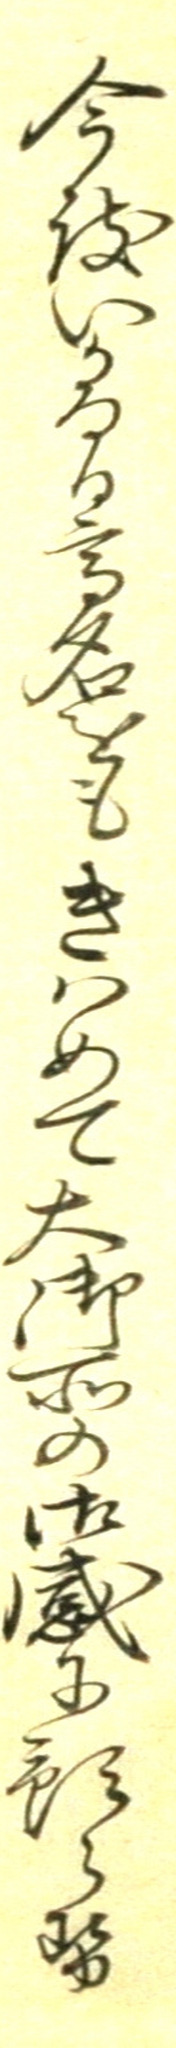今度いかなる高名をもきはめて大御所の御感に預らせ
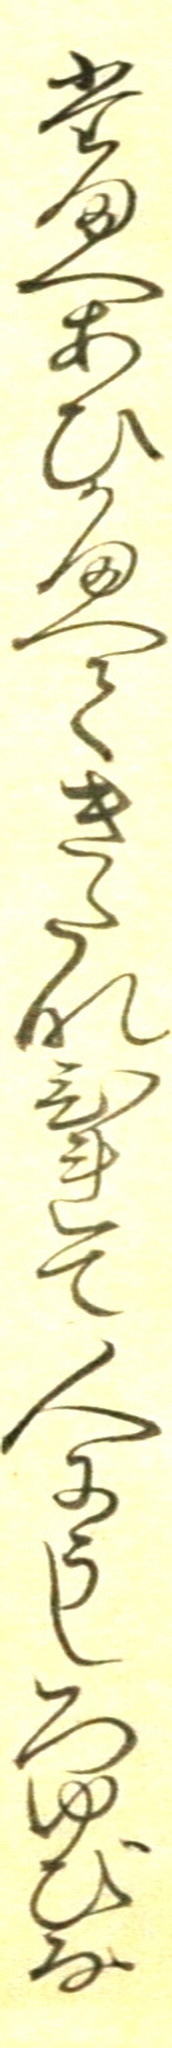たまへあひかまへてきたなひれて人にうしろゆびな
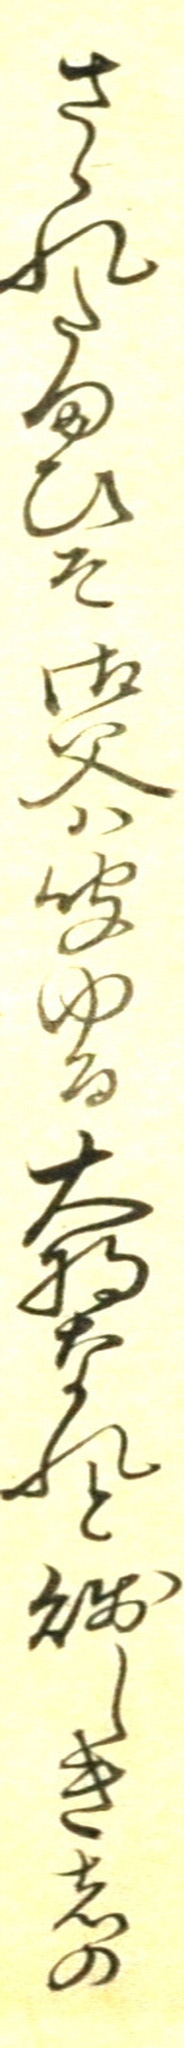さゝれたまひそ御父は聞ゆる大将なれと賤しき者の
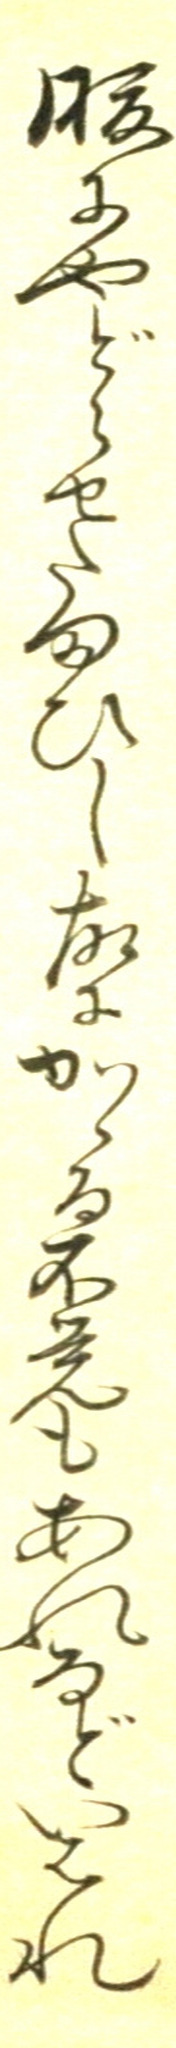腹にやどらせたまひし故にかゝる不覚もあれなどいはれ
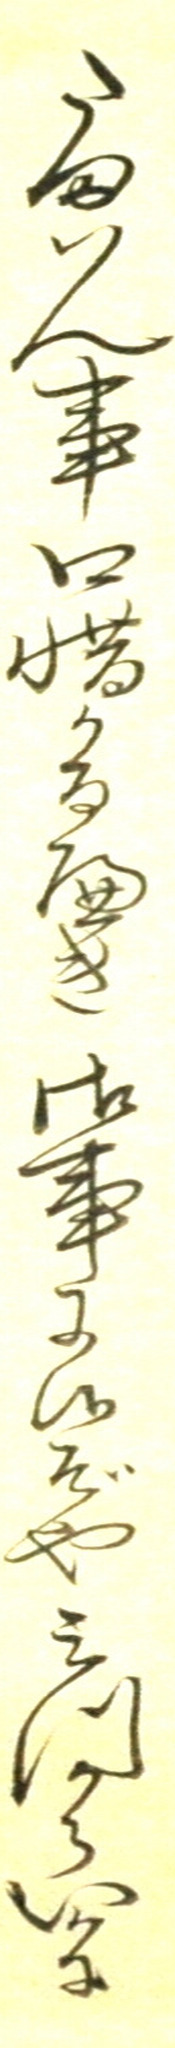たまはん事口惜かるへき御事に候ぞやみつからいかに
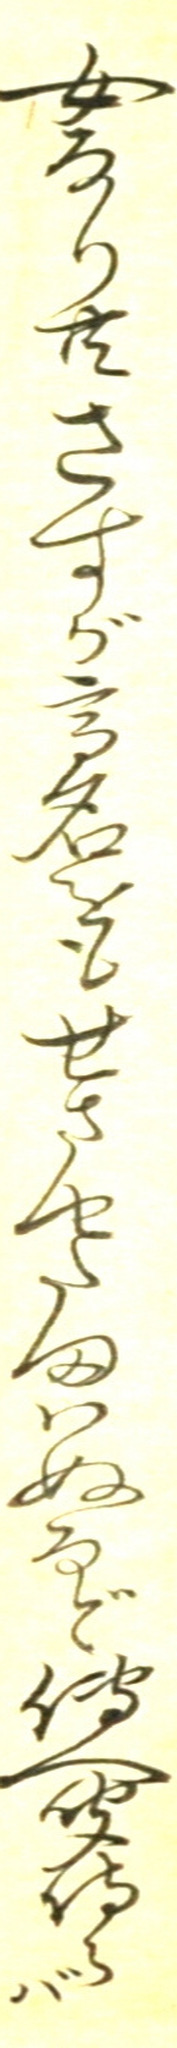女なり共さすが高名をもせさせたまはぬなど伝へ聞侍らば
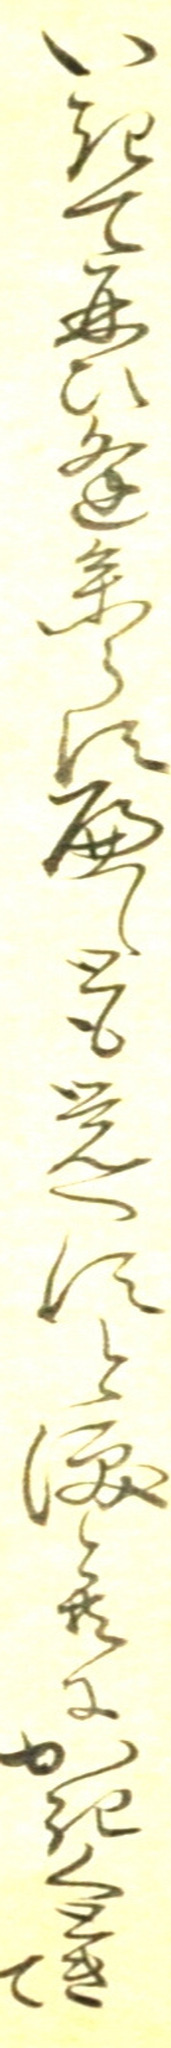いきて再ひ逢参らすへしとも覚へすと涙と共にかきくときて
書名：藩翰譜（一）
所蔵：伊那市立高遠町図書館・合同会社AMANE
